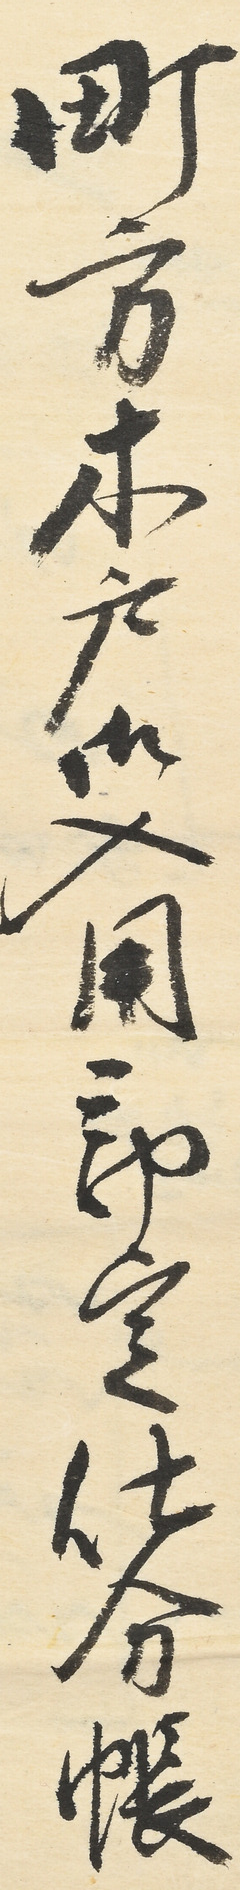町方木戸御入用勘定仕分帳

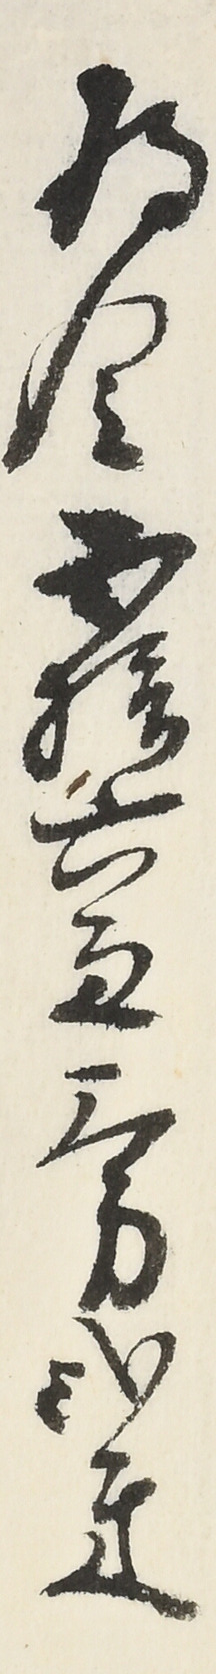為金五拾六両三分弐朱
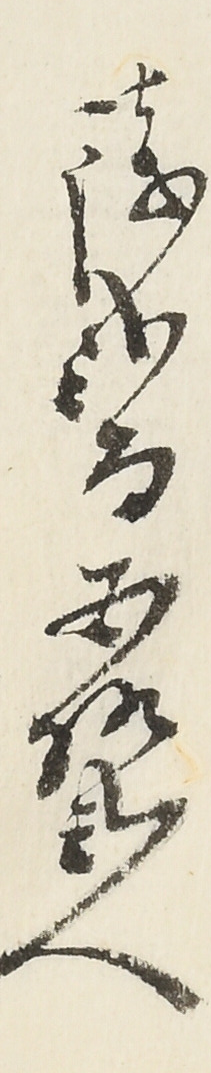銭弐百五拾弐文

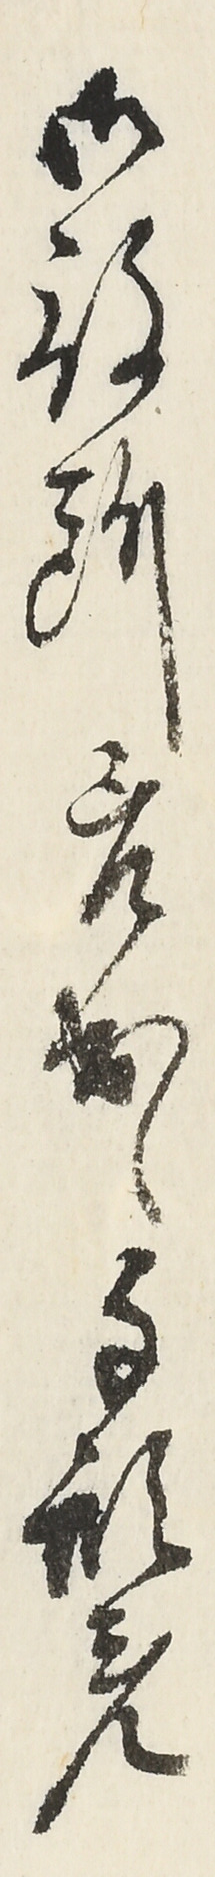御役所差出候手形覚
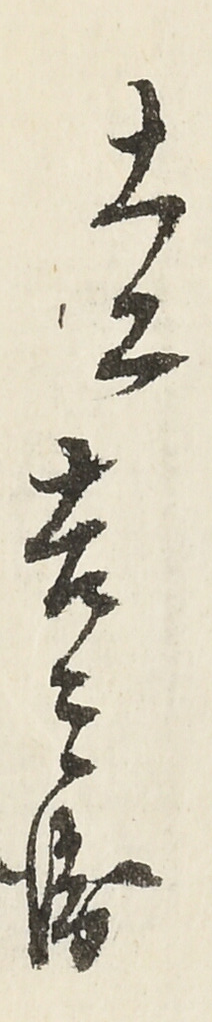吉兵衛
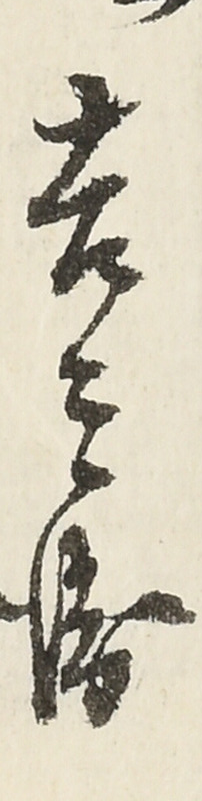吉兵衛
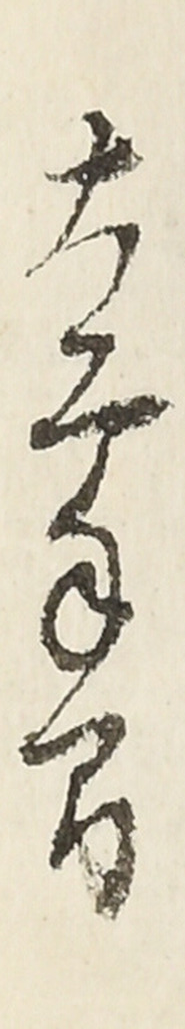大工手間
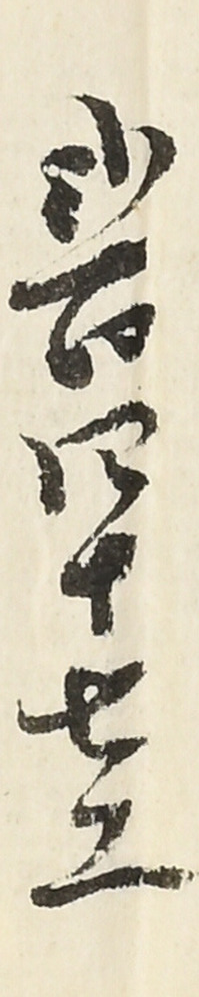弐百四十七工
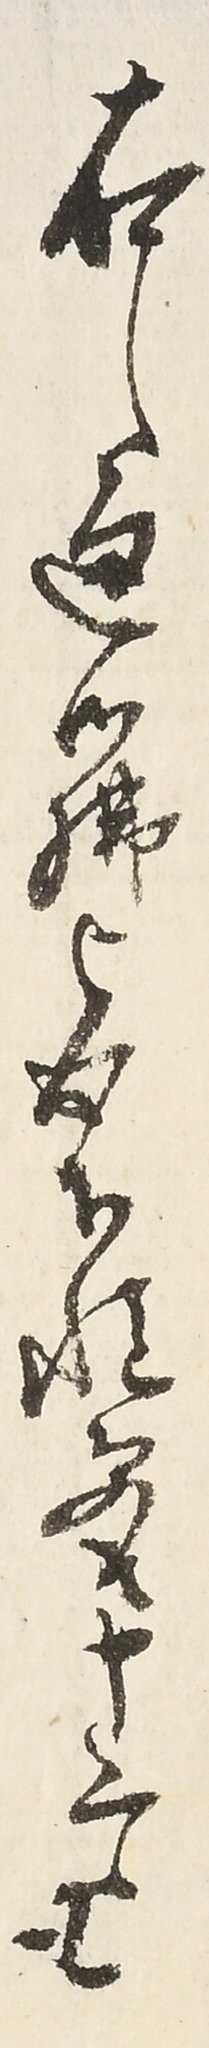右之通御払被成下慥受取申上候已上
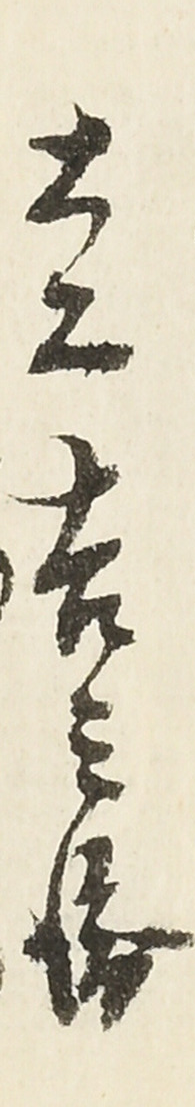大工吉兵衛
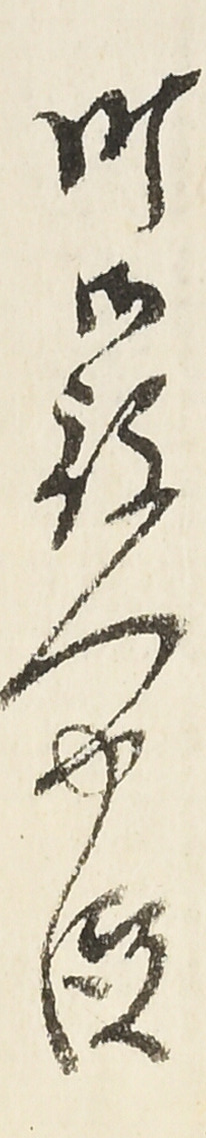町御役人中様

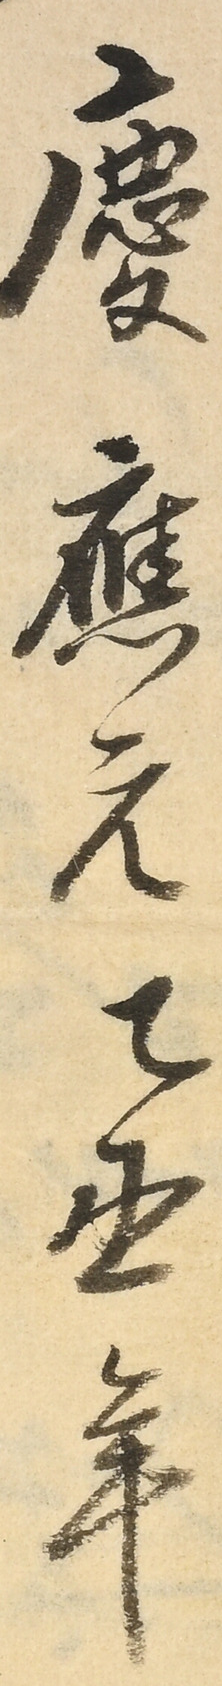慶応元乙丑年
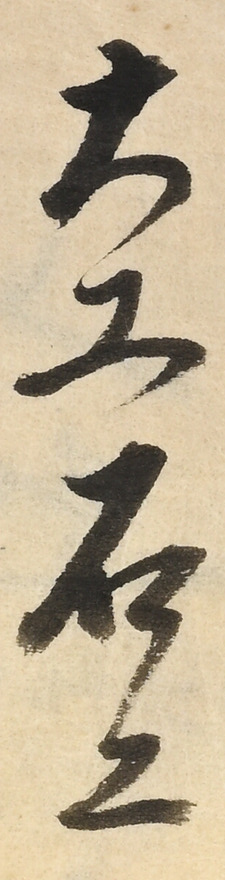大工石工
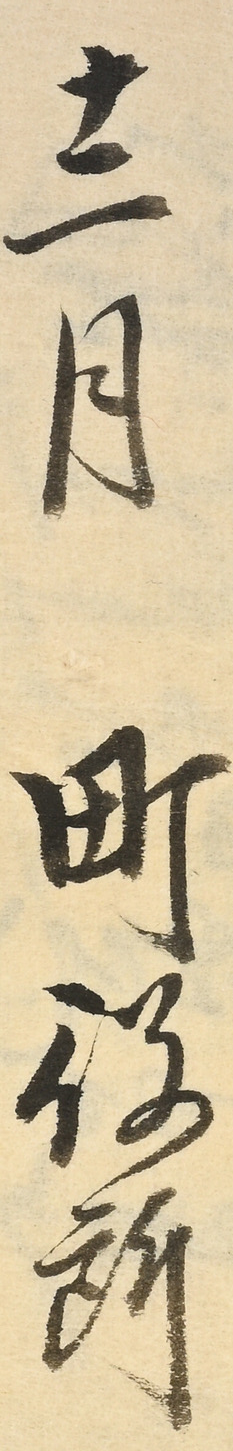十二月町役所

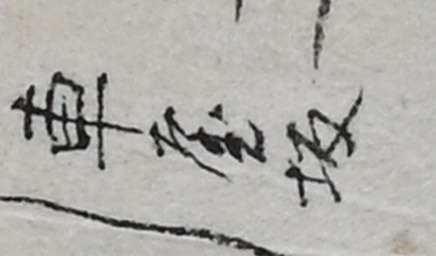車屋坂
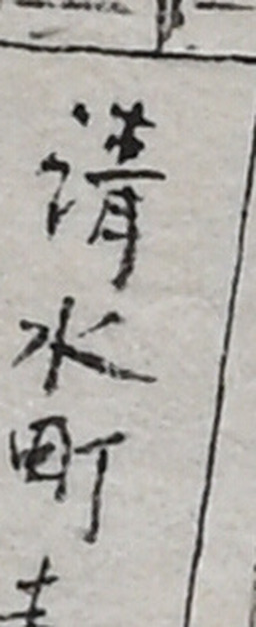清水町
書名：町方木戸御普請諸事附（一括）
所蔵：伊那市立高遠町図書館・合同会社AMANE
